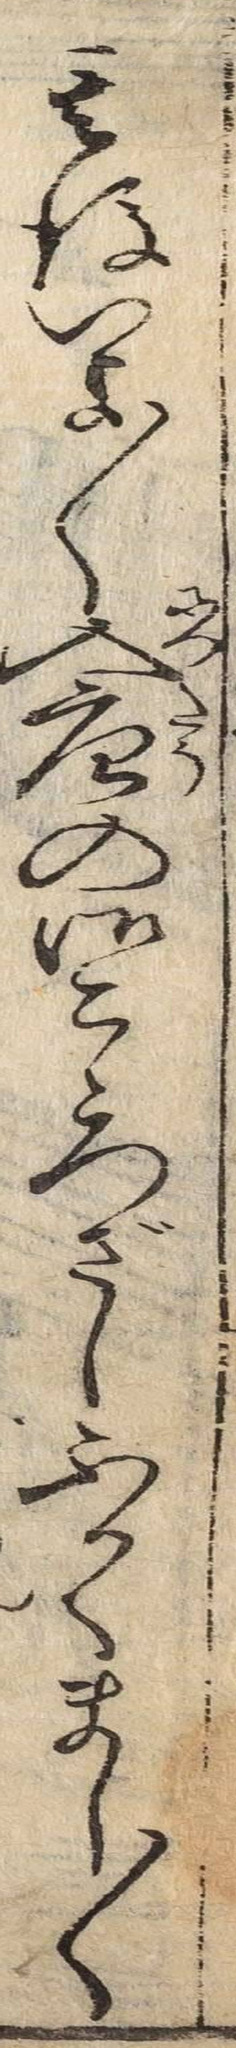其後いよ〳〵入唐の御こゝろざしふかくまし〳〵
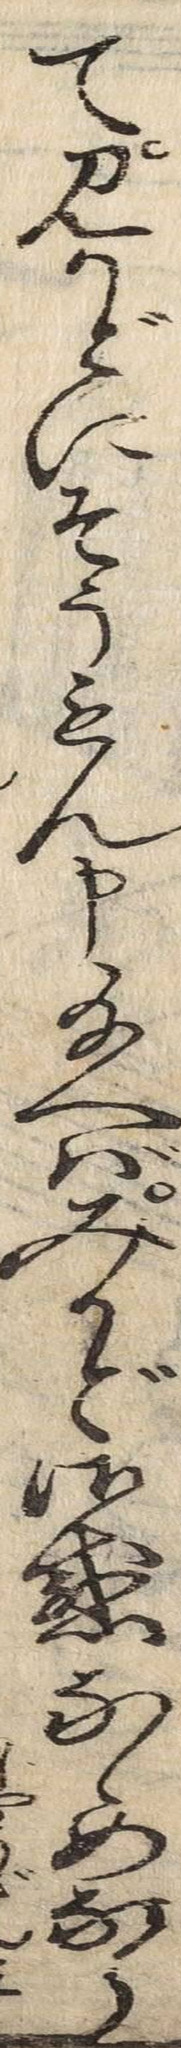て。みかどにそうもん申給へば。みかど御感なゝめなら
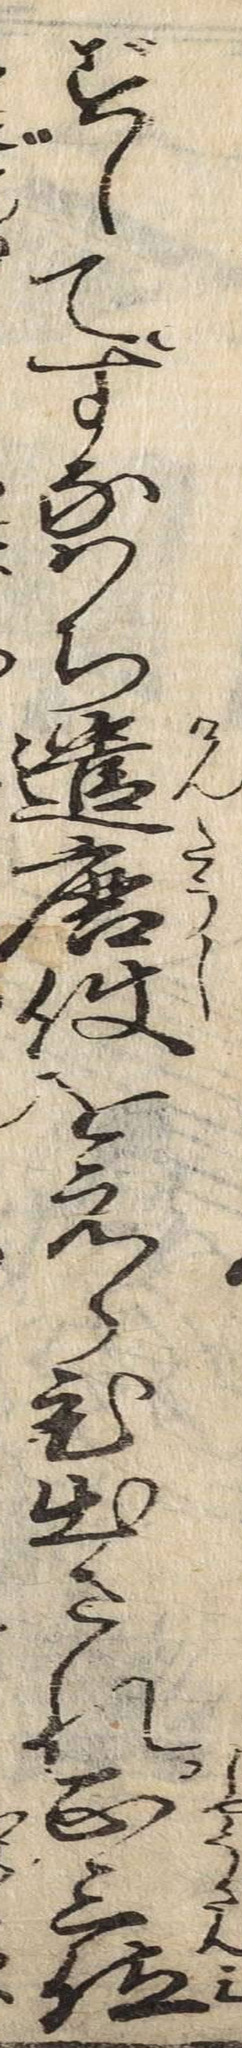ずして。すなはち遣唐使をえらひ出され。正三位
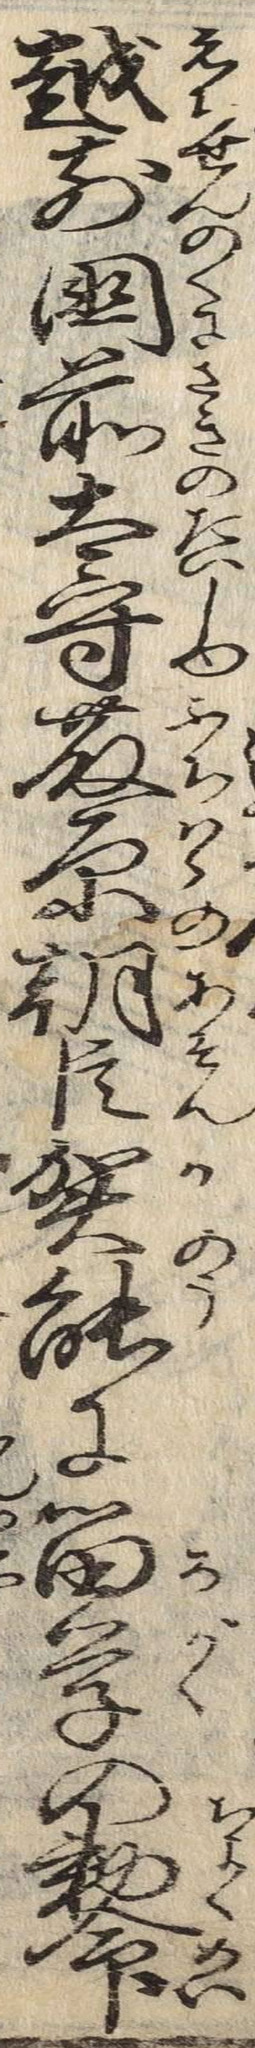越前国前太守藤原朝臣賀能に留学の勅命
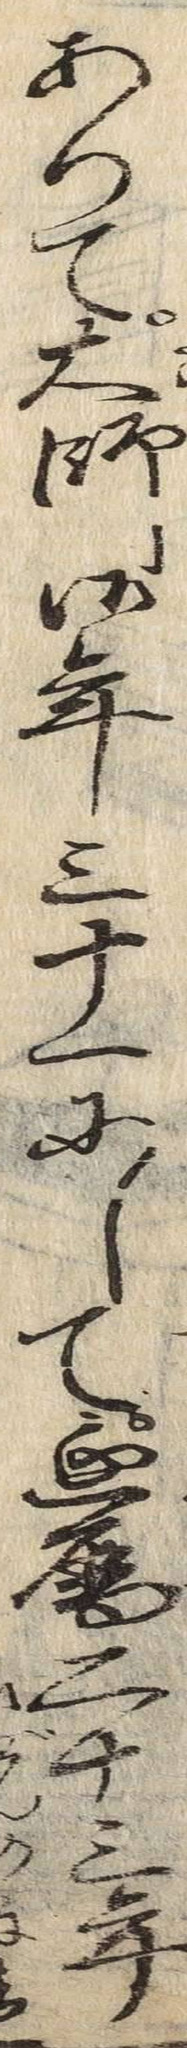ありて。大師御年三十一にして。延暦二十三年
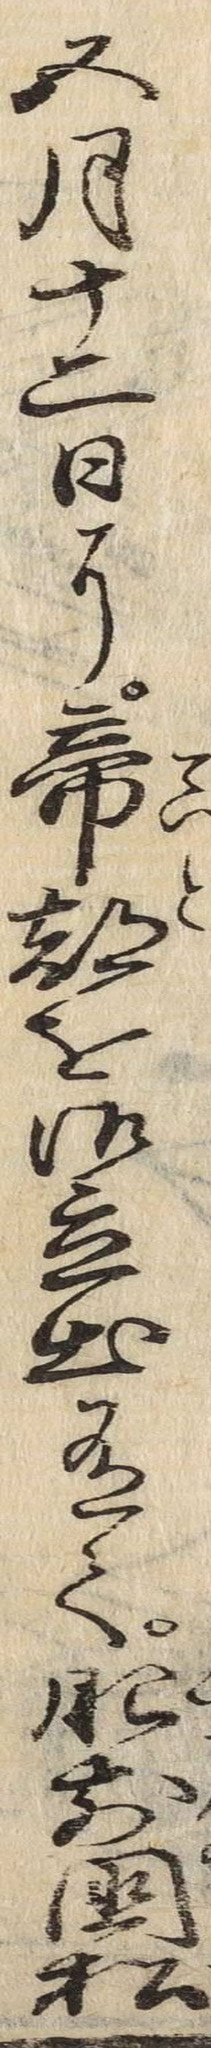五月十二日に。帝都を御立出有て。肥前国松
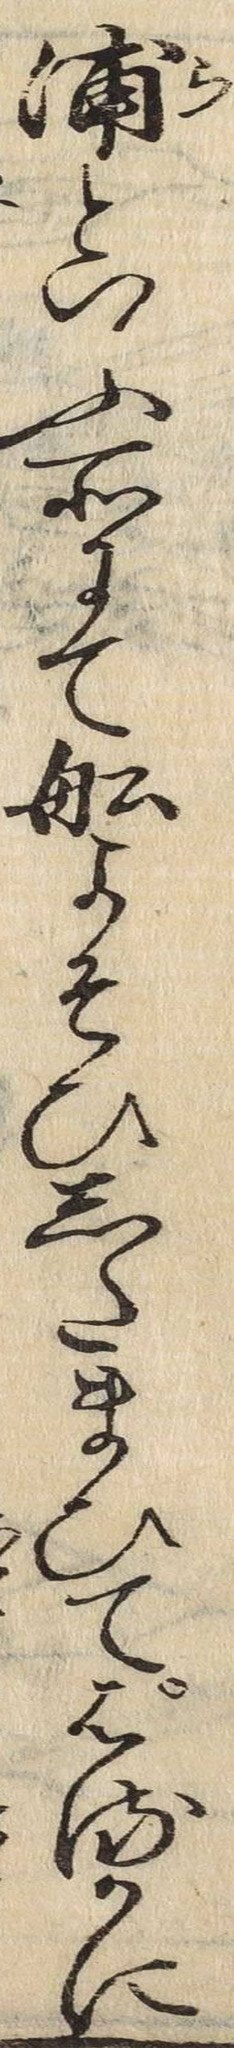浦といふ所にて船よそひしたまひて。はるかに
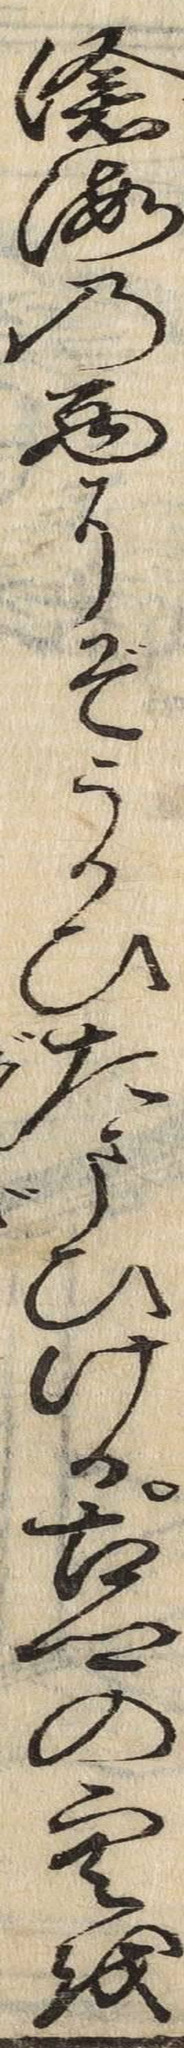滄海の西にそうかひたまひける。古郷の空を
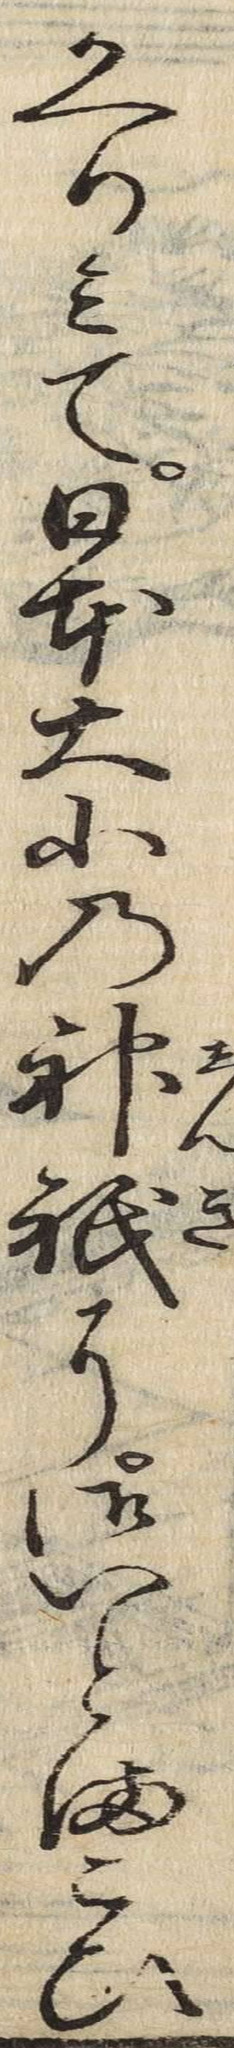かへりみて。日本大小の神祇に。御いとまこひ
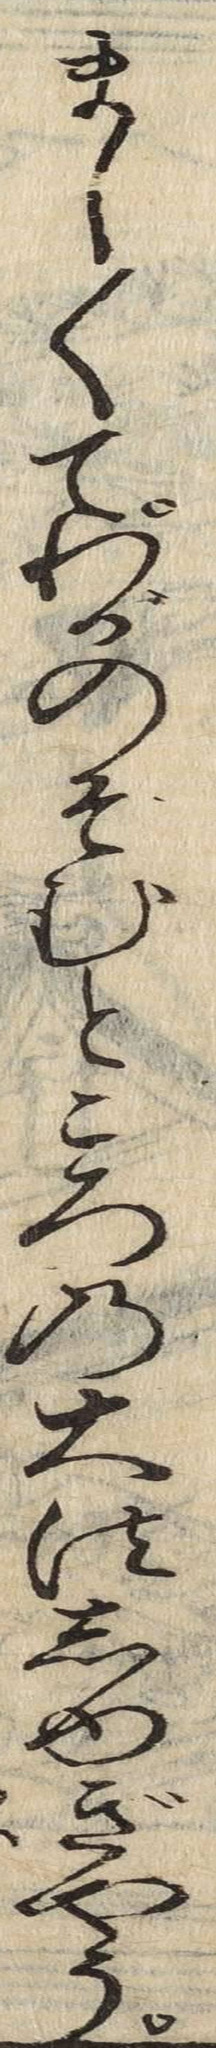まし〳〵て。わかのそむところの大法しゆぎやう。
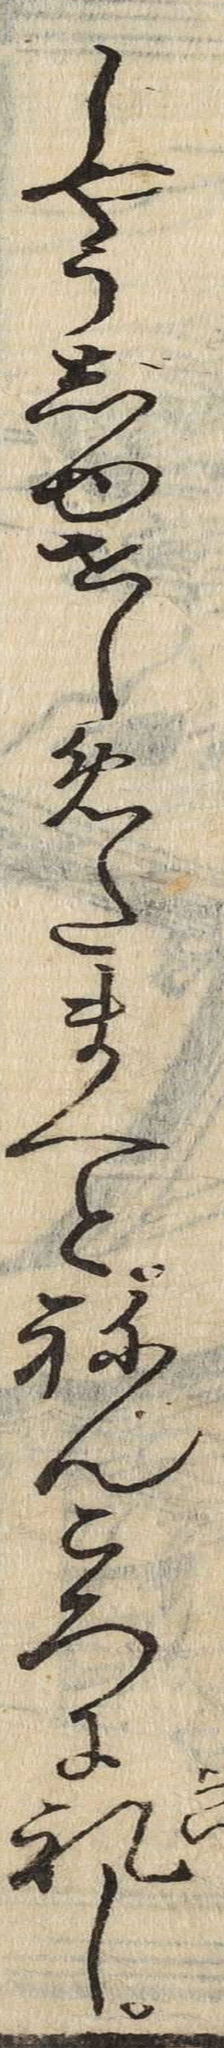しやうしゆさしめたまへと。ねんころに礼し
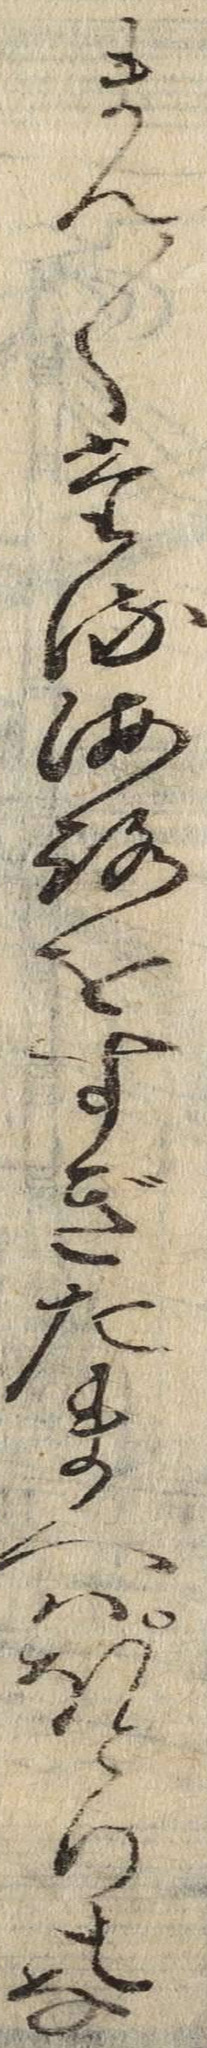まん〳〵たる海路をすぎたまへは。ほとりもな
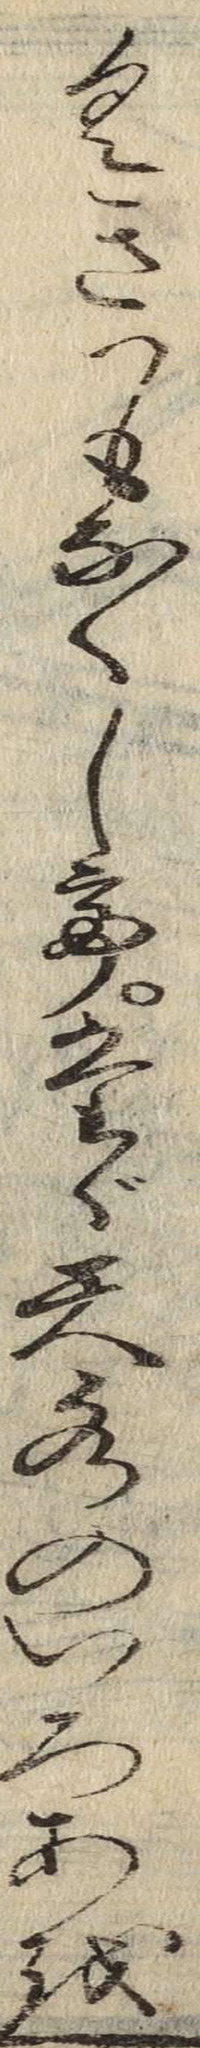くきはもなくして。たゞ天水のいろあを
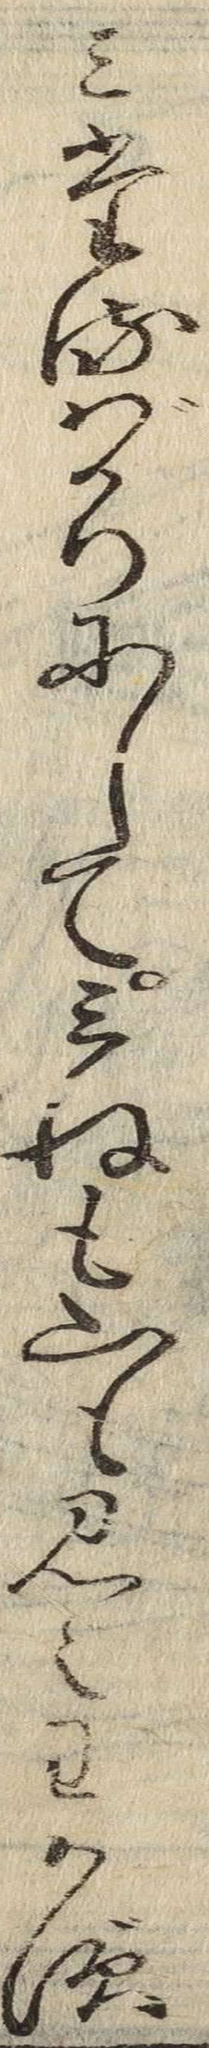みたるばかりにして。みねも山も見えわかず
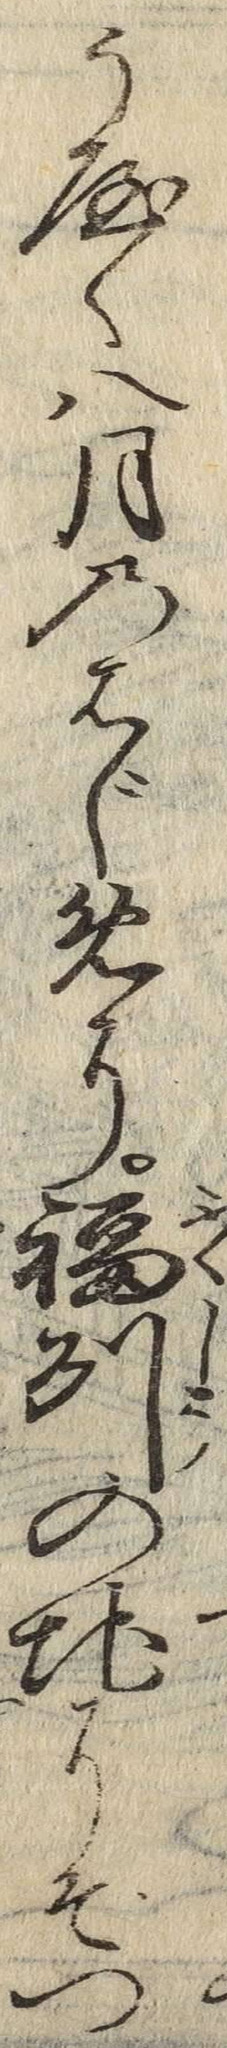日をおくり。月のはじめに。福州の地にそつ
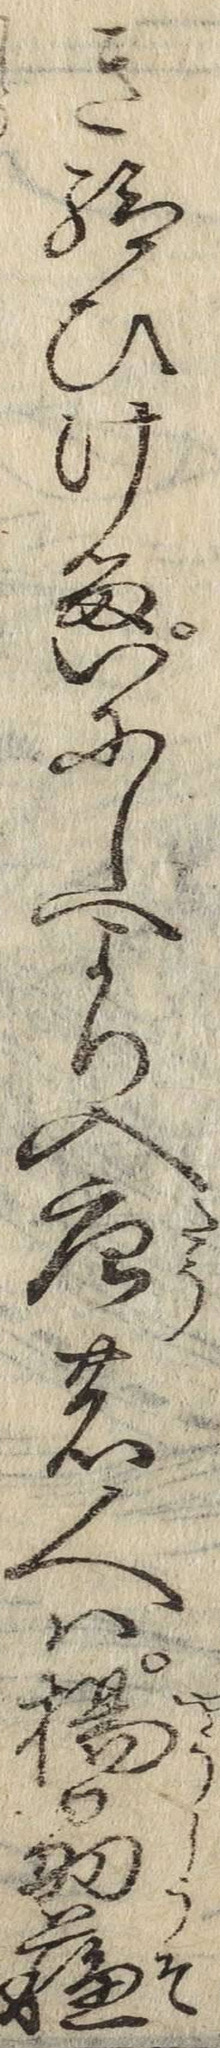き給ひける。いにしへより入唐の人は。揚州蘇
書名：弘法大師御傳記
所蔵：京都府立京都学・歴彩館 国文学研究資料館
